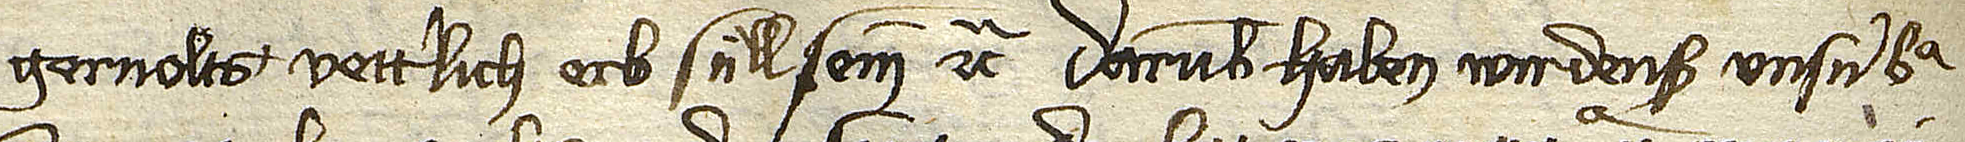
gernolts vett*lich erb ſüll ſein ec* Daru*b haben wir denſ* vnſ*n b*
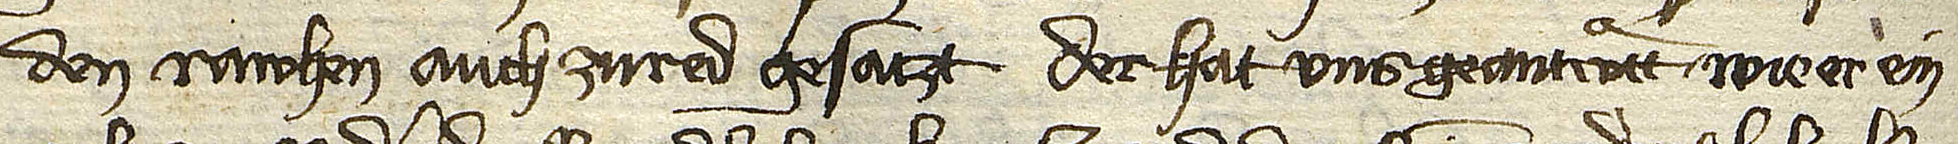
den rawhen auch ʒured geſacʒt der hat vns geantw*tt wie er ein
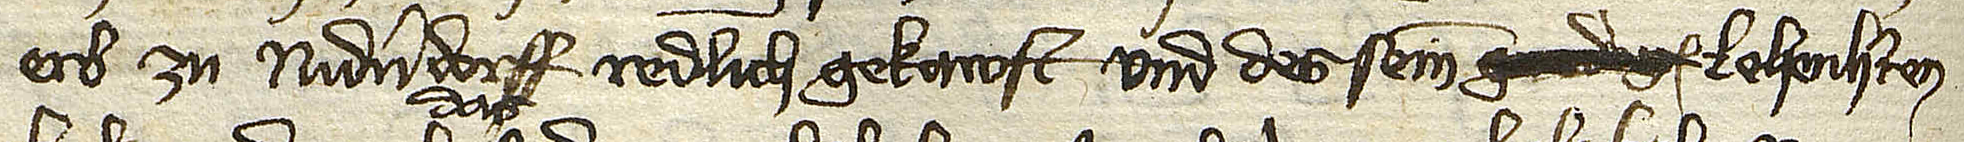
erb ʒu Nid*ndorff redlich gekawft vnd des ſein* gnedig* lehenh*ren
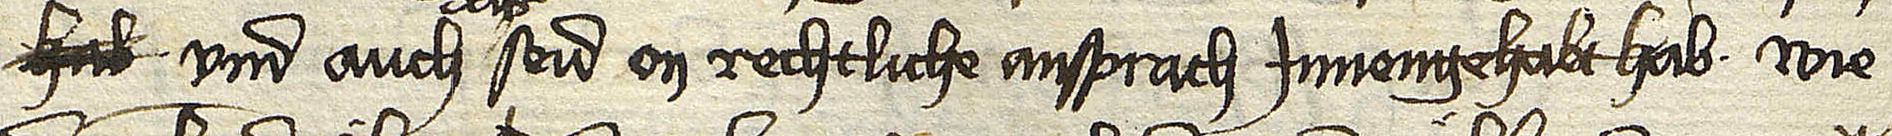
hab vnd auch ſeid on rechtliche anſprach Innengehabt hab . wie
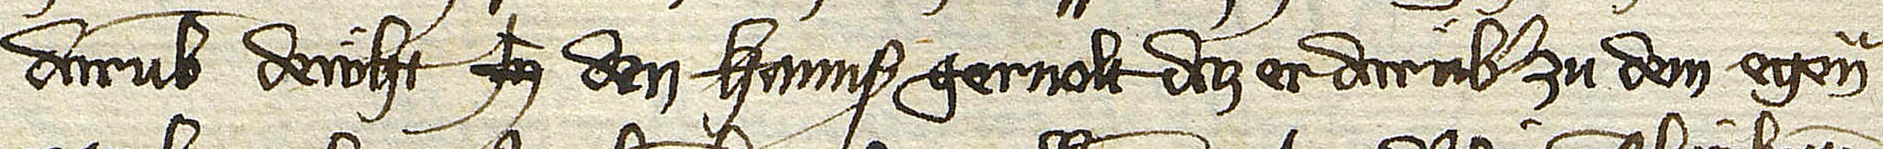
daru*b dewcht In den hannſ* gernolt daʒ er darüb* ʒu dem egen*
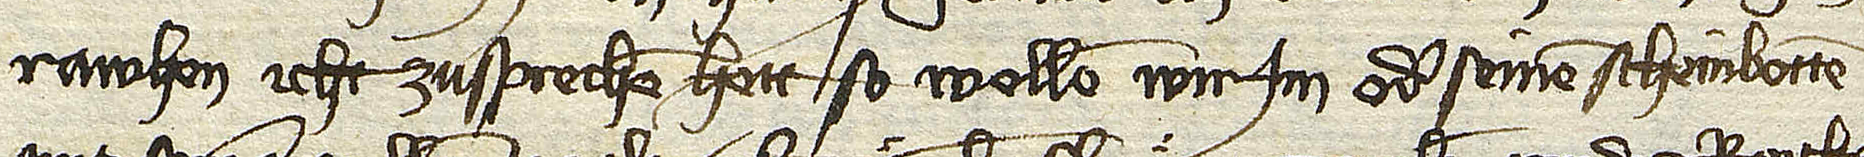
rawhen icht ʒuſpreche* hett ſo welle* wir Im od* ſeine* ſcheinbotte*
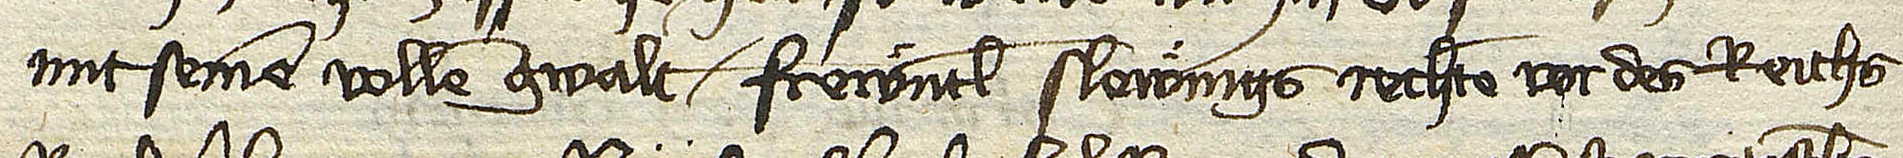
mit ſeine* volle* gwalt / frewntl* ſlewnigs rechte* vor des Reichs
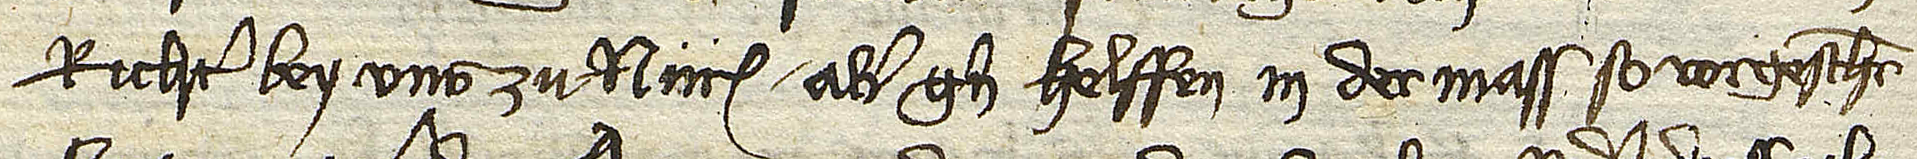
Richt* bey vns ʒu Nür* / ab* g*n helffen in der maſſ ſo vorgeſchr*
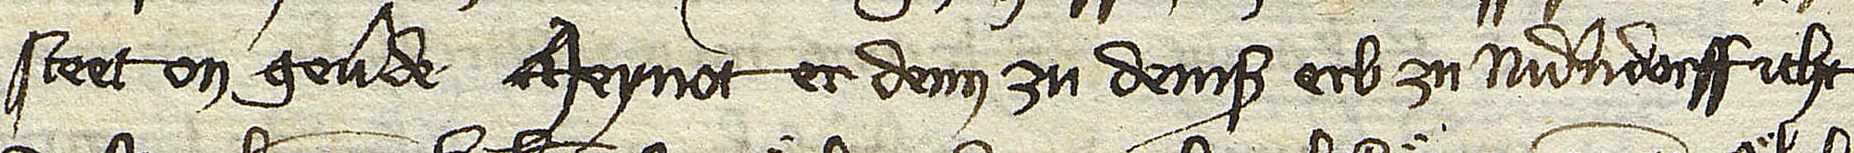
ſteet on geu*de Meynot er denn ʒu demſ* erb ʒu Nid*ndorff icht
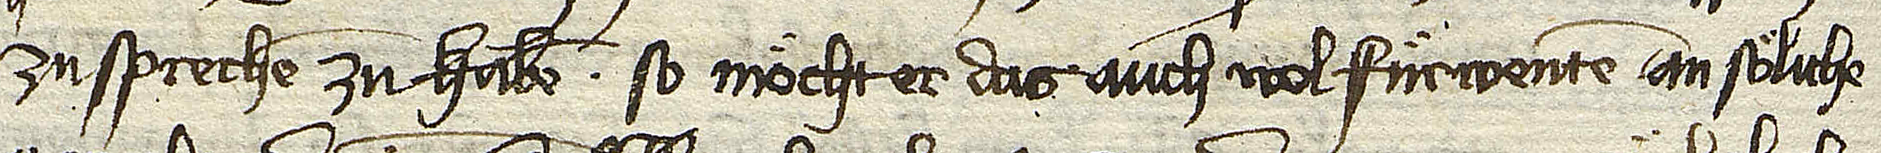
ʒu ſpreche* ʒu habe* . ſo möcht er das auch wol fürwente* / an ſöliche
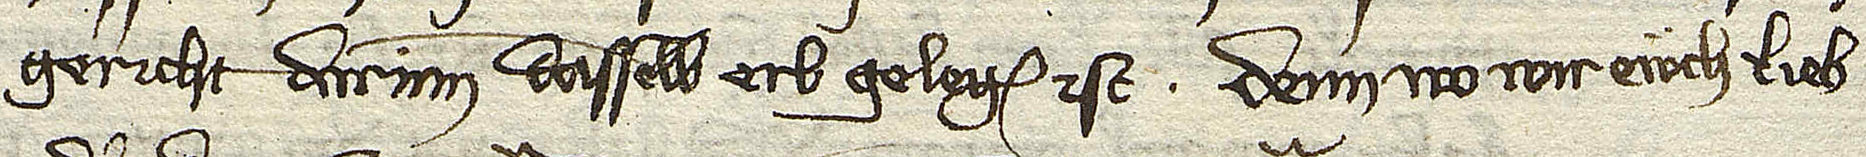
gericht darinn* daſſelb erb geleg* iſt . Denn wo wir ewch lieb
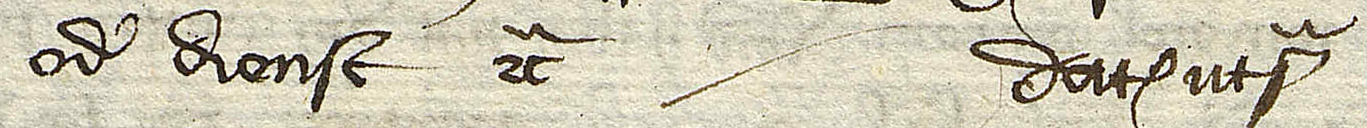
od* dienſt ec* / Dat* ut ſ*
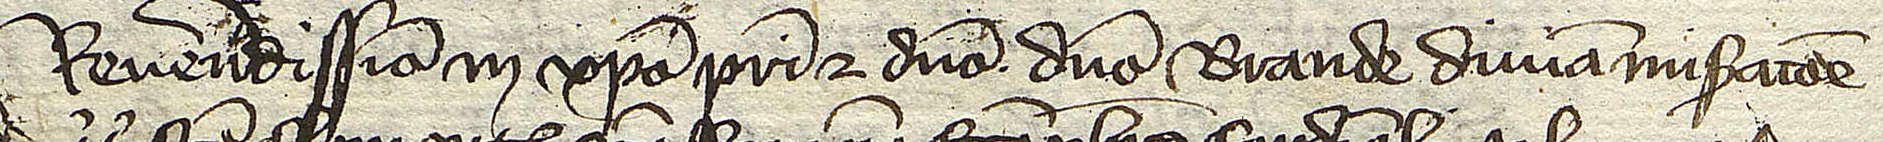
Reue*ndiſſi*o in xpo* p*ri @ d*no . d*no Brande diui*a miſ*ac*i*e
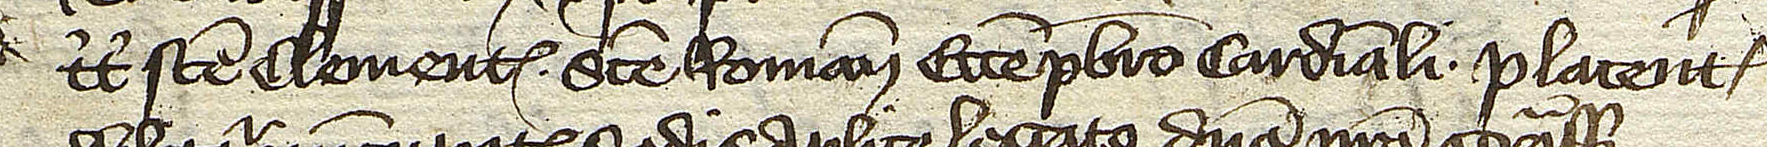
t*t* ſ*te Clement* . S*te Roman* Ecc*e p*b*ro Cardi*ali . placent*
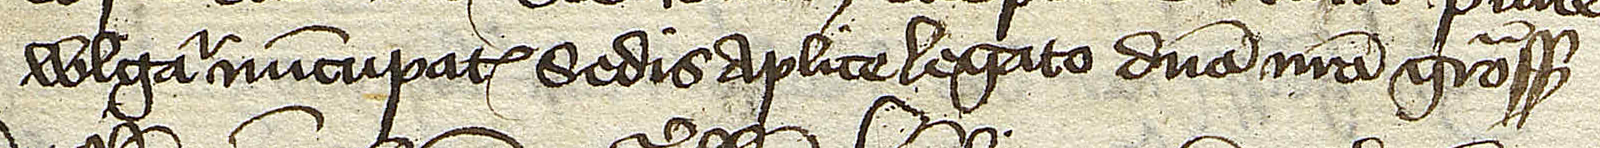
w*lga* nu*cupat* Sedis Ap*lice legato d*no n*ro g*roſſ*
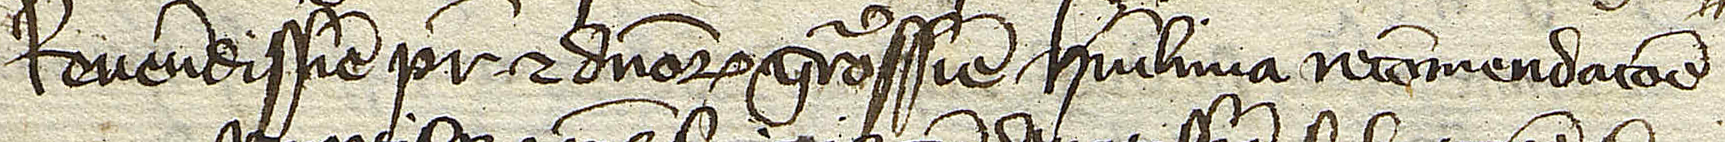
Reue*ndiſſi*e p*r @ d*no* g*roſſi*e / Hu*ilima reco*mendac*o*e
